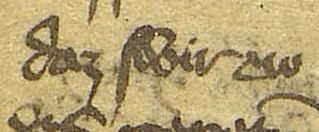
daʒ wir ew
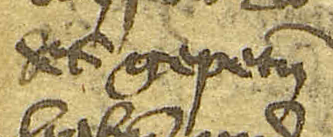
des gepetn*
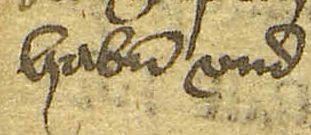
habn* vnd
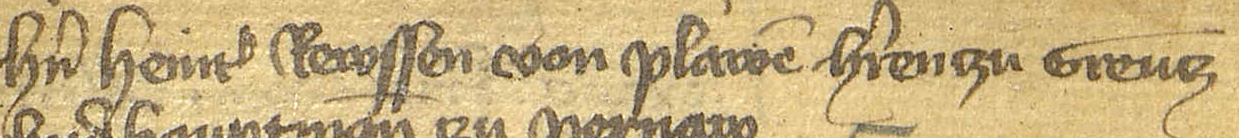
hn* heinr* Rewſſen von Plawe* h*ren cʒu Greucʒ
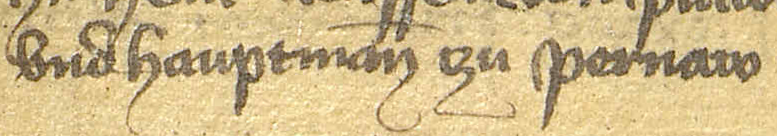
vnd hauptman* cʒu Pernaw
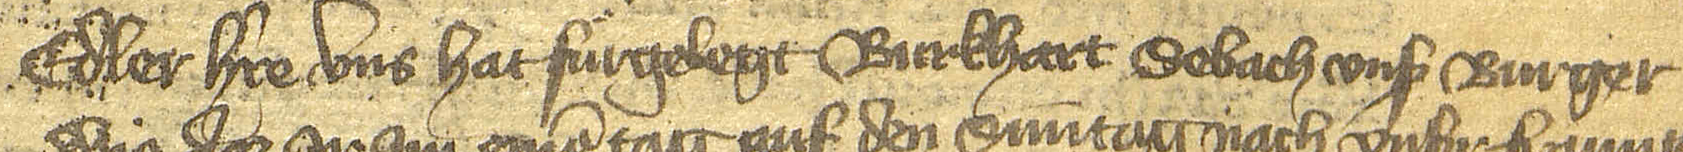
Edler h*re / Vns hat fürgelegt Burkhart Sebach vnſ* Burger
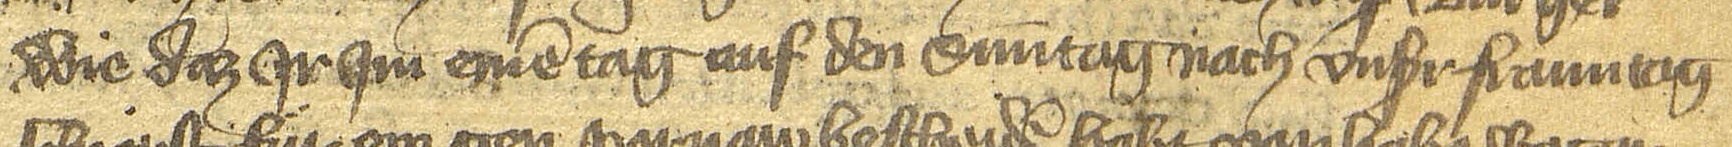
wie daʒ Ir Im eine* tag auf den Sun*tag nach vnſ*r frauntag
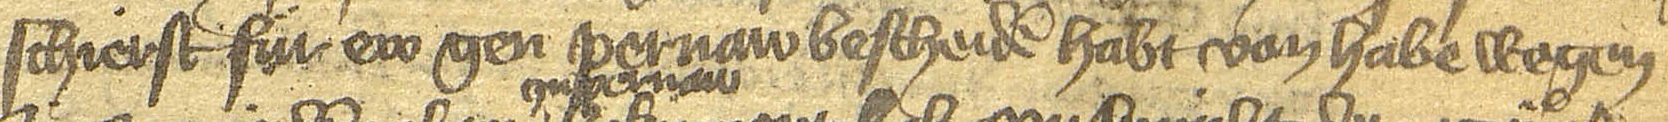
ſchierſ für ew gen Pernaw beſcheide* habt von habe wegen
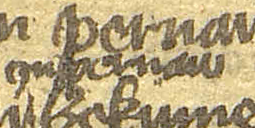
In pernaw
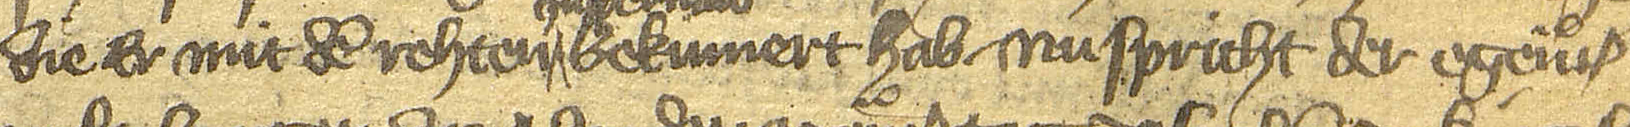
die Er mit de* rehten bekumert hab / Nu ſpricht der egen*t*
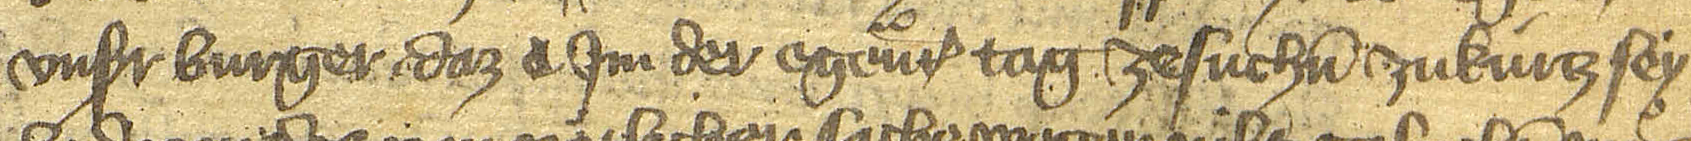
vnſ*r burger / daʒ e Im der egen*t* tag cʒeſuchn* cʒukürcʒ ſey
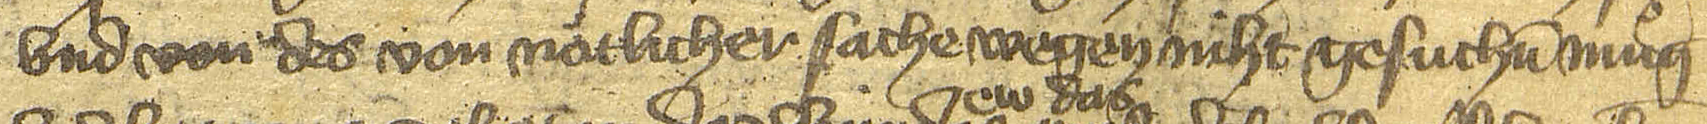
vnd von des von nötlicher ſache wegen niht geſuchn* müg
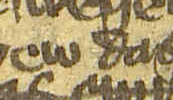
ew das
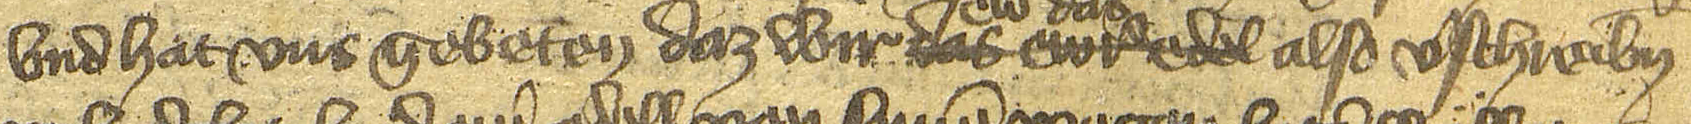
vnd hat vns gebeten daʒ wir das ewr* edel alſo v*ſchreibn*
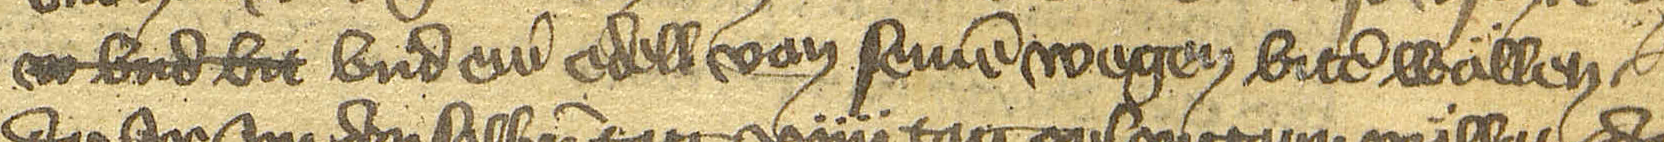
vo vnd bit vnd ew* edell von ſeine* wegen bite* wöllen /
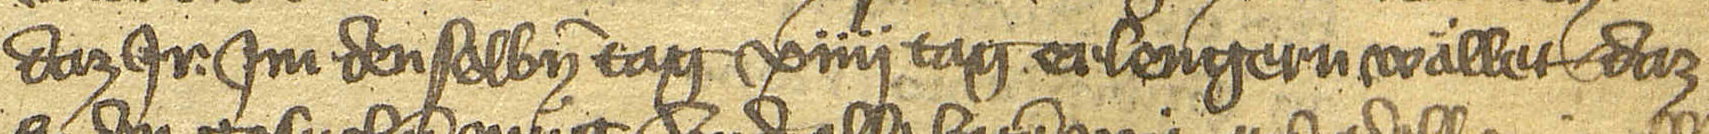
daʒ Ir Im denſelbn* tag xiiii tag erlengern wöllet / daʒ
